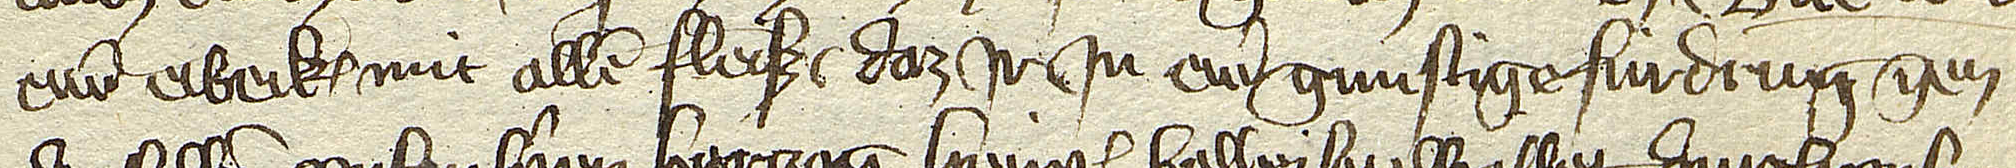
ew* erberk* mit alle* fleiſʒ* / daʒ Ir In ew* gunſtige fürdrug* gen
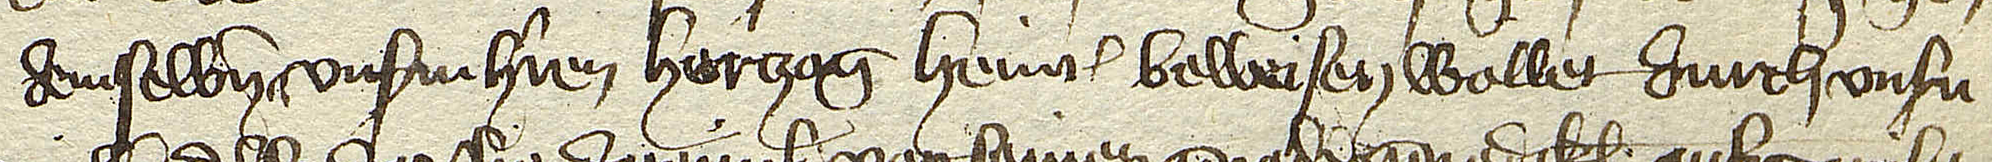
demſelbn* / vnſ*m h*ren hercʒog heinr* beweiſen wollet durch vnſ*n
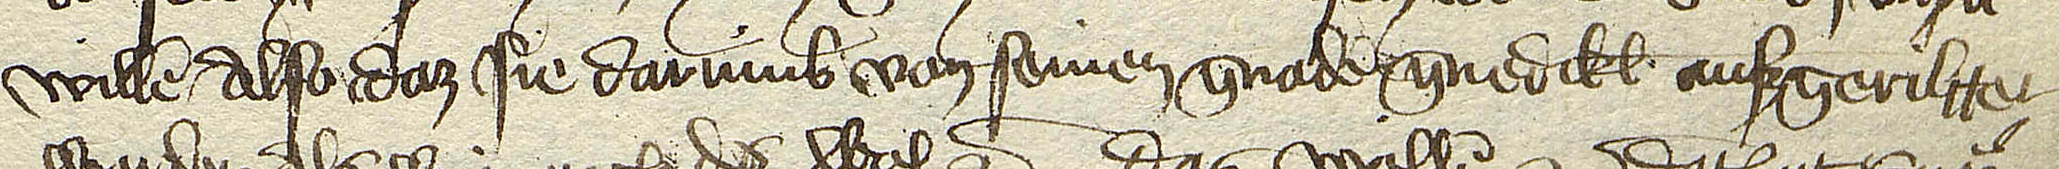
wille* / Alſo / daʒ ſie darümb von ſeinen gnade* gnedikl* ausʒgerihtet
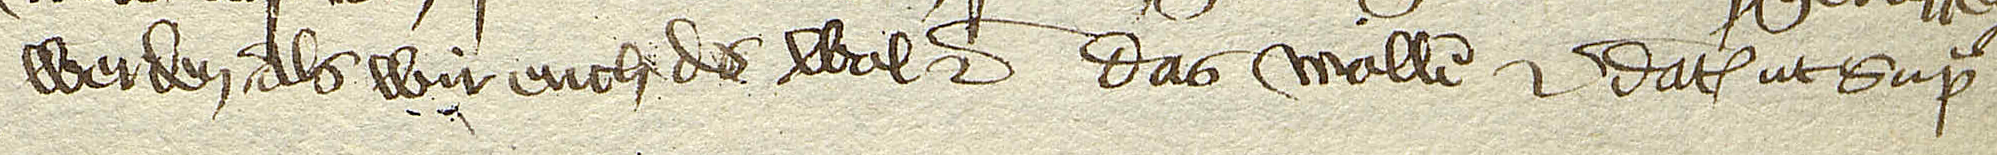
werden / Als wir euch das wol ec* das wölle* ec* / dat* ut Sup*
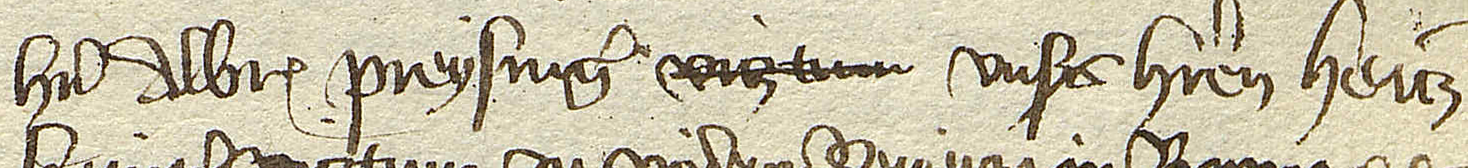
hn* Albr* Preyſing* vicʒtum vnſ*s hr*en hercʒ*
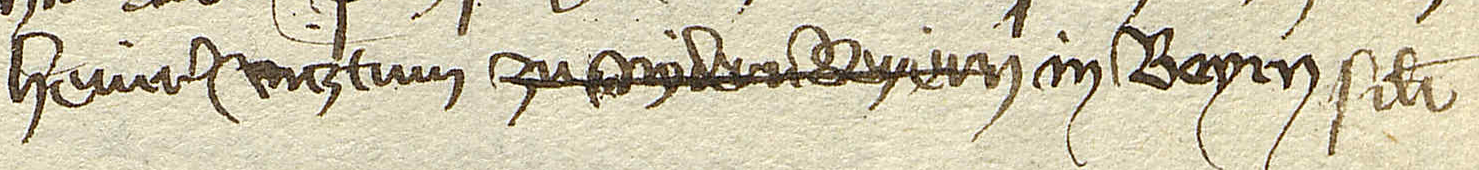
heinr* vicʒtum cʒu Nydern* Beyern in Beyrn ſilr*
